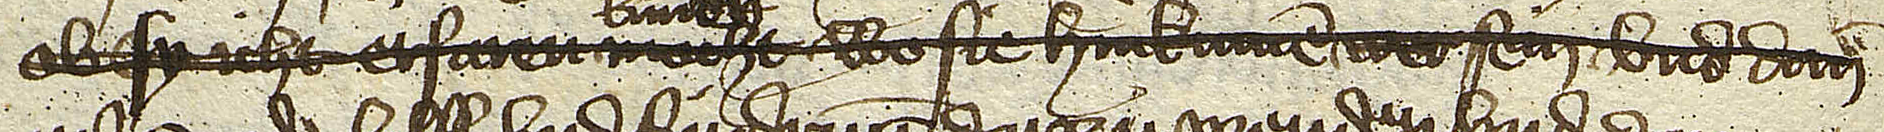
ob ſy icht erfaren mocht / wo ſie hinkume* ſein vnd dan*
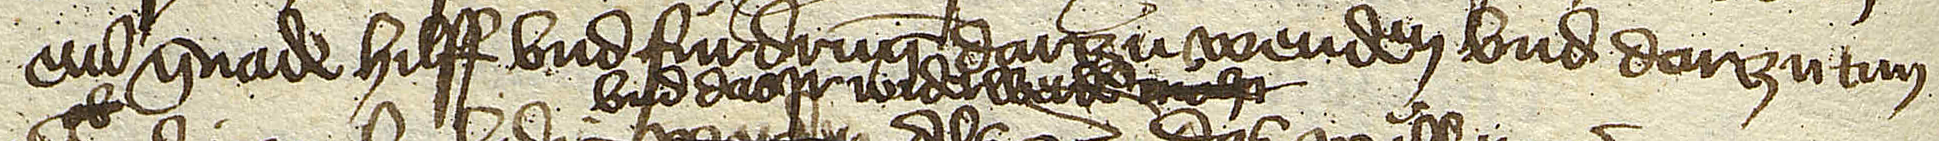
ew* gnade hilff vnd fürdrug* darcʒu wenden vnd darcʒu tun
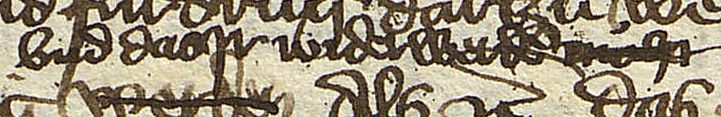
vnd das Ir widerwerde möht
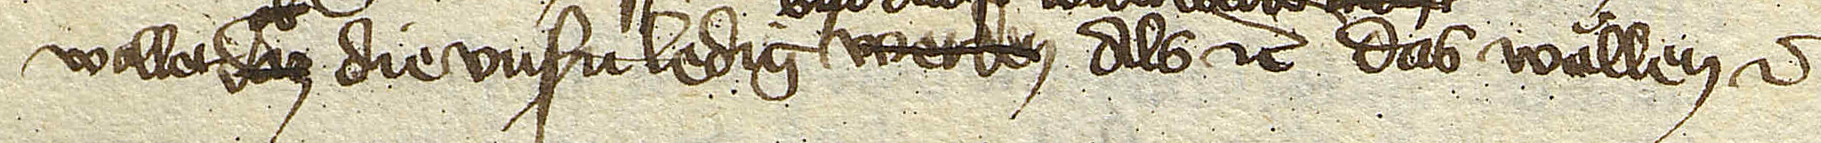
wollet daʒ die vnſ*n ledig werden Als ec* das wöllen ec*
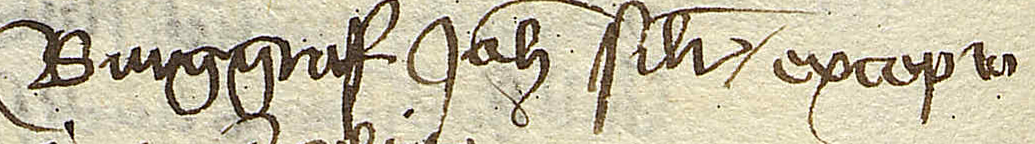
Burggraf Ioh* ſilr* excep*
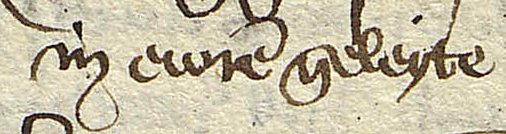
in ewre* geleyte
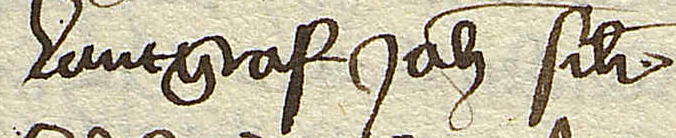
Lantgraf Ioh* ſilr*
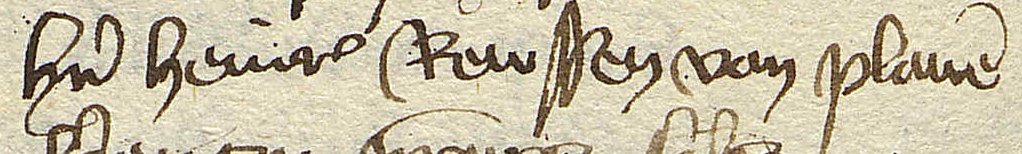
hn* heinr* Rewſſen vpn plawe*
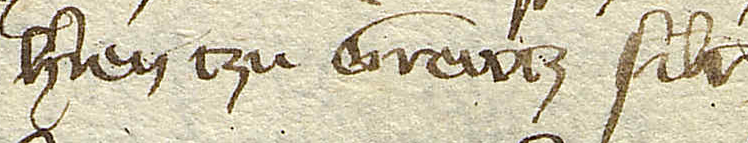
hr*en cʒu Grewcʒ ſilr*
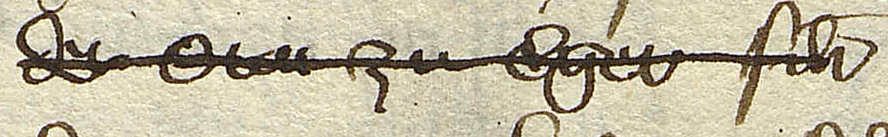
der Stat cʒu Eger ſilr*
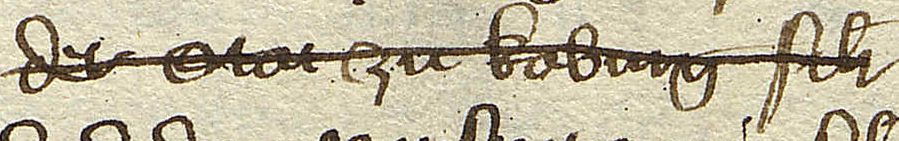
der Stat cʒu koburg ſilr*
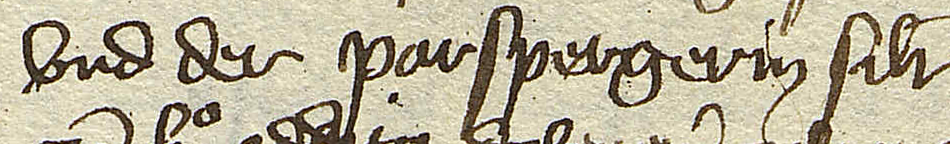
vnd der parſpergerin ſilr
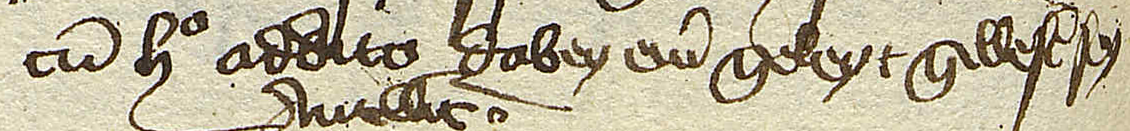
cu* h* addito dabey ew* geleyt geweſe* ſey
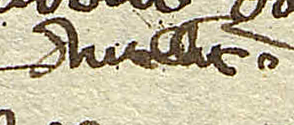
Antwt*
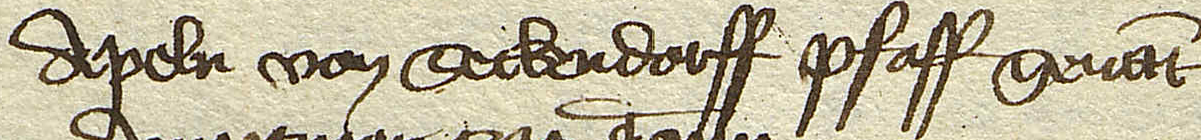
Apeln von Seckendorff pfaff genat*
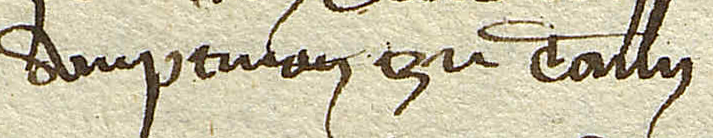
Amptman cʒu Taun
